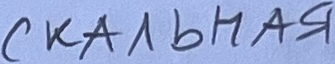скальная
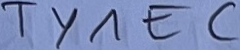тулес
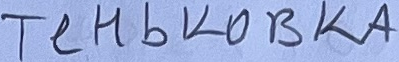теньковка
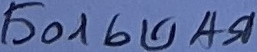большая
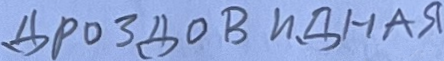дроздовидная
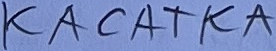касатка
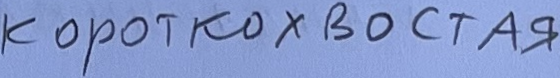короткохвостая
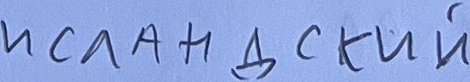исландский
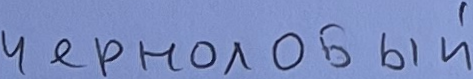чернолобый
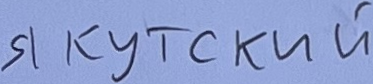якутский
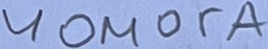чомога
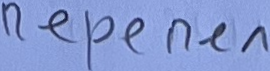перепел
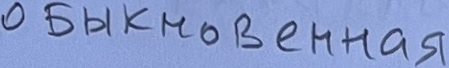обыкновенная
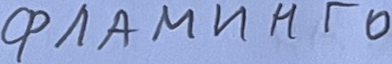фламинго
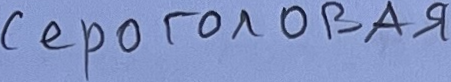сероголовая
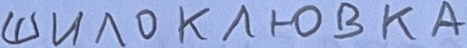шилоклювка
